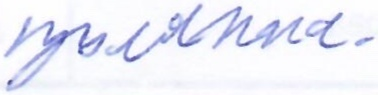просянка
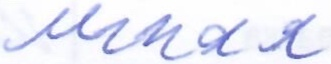лесняя
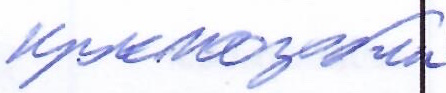краснозобик
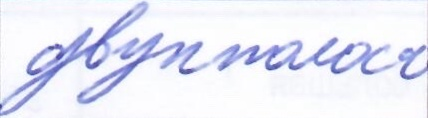двухполося
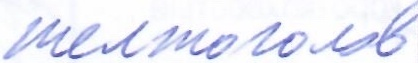желтоголов
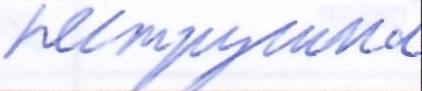пеструшка
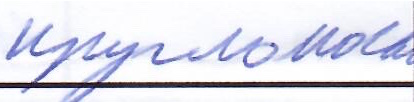круглоносы
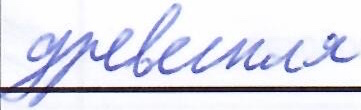древесная
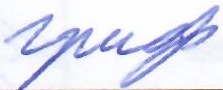гриф
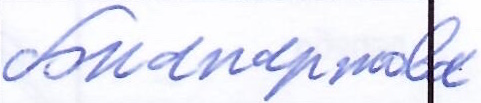бонапартова
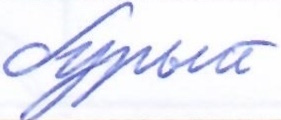бурый
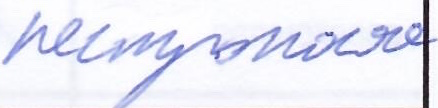пестроносяя
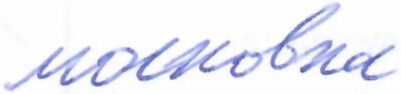московка
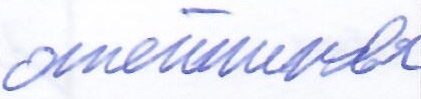ошейниковя
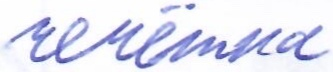чечётка
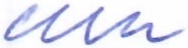сип
